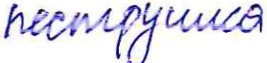пеструшка
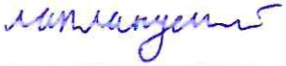лапландский
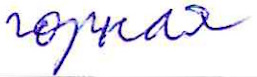горная
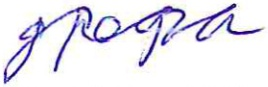дрофа
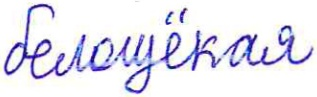белощёкая
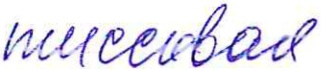тиссовая
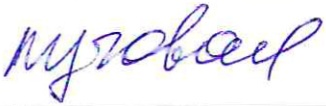луговая
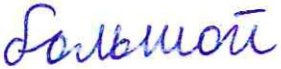большой
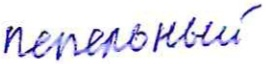пепельный
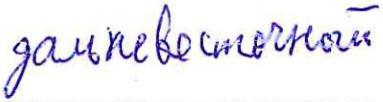дальневосточный
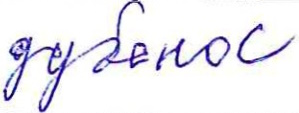дубонос
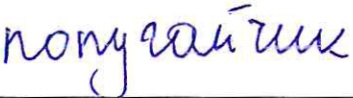попугайчик
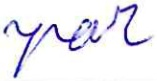грач
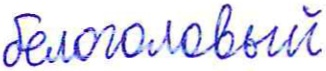белоголовый
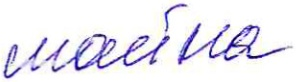майна
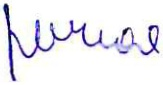речная
